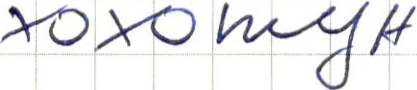хохотун
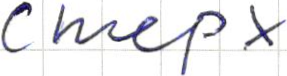стерх
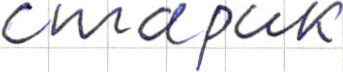старик
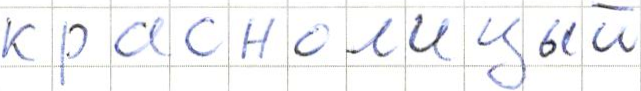краснолицый
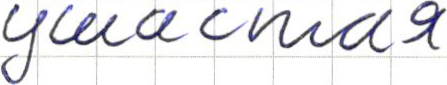ушастая
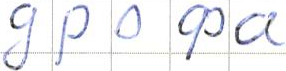дрофа
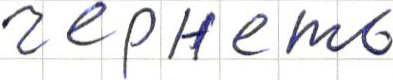чернеть
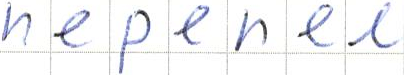перепел
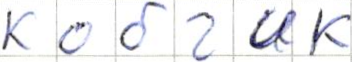кобчик
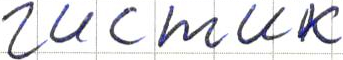чистик
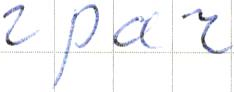грач
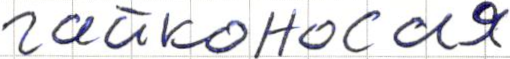чайконосая
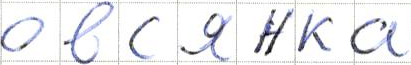овсянка
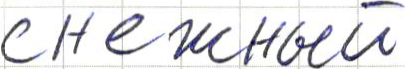снежный
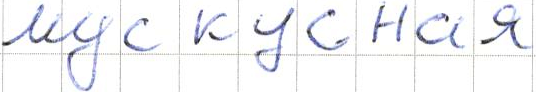мускусная
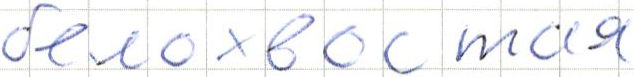белохвостая
